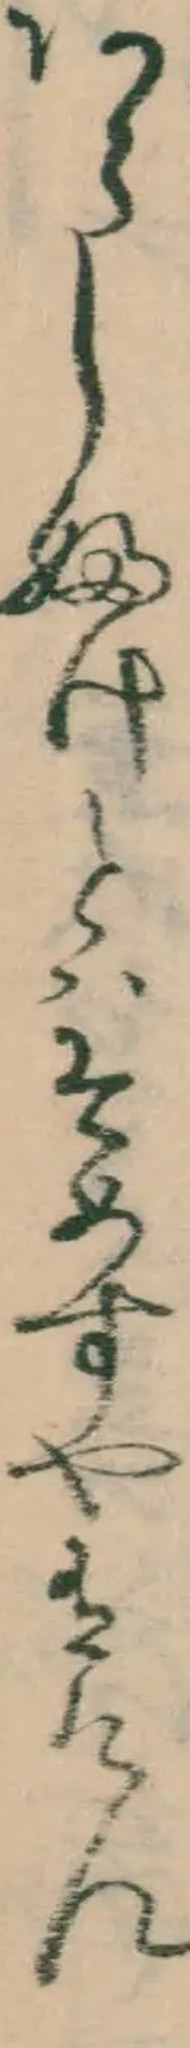あらしふけとはそめすや有けん

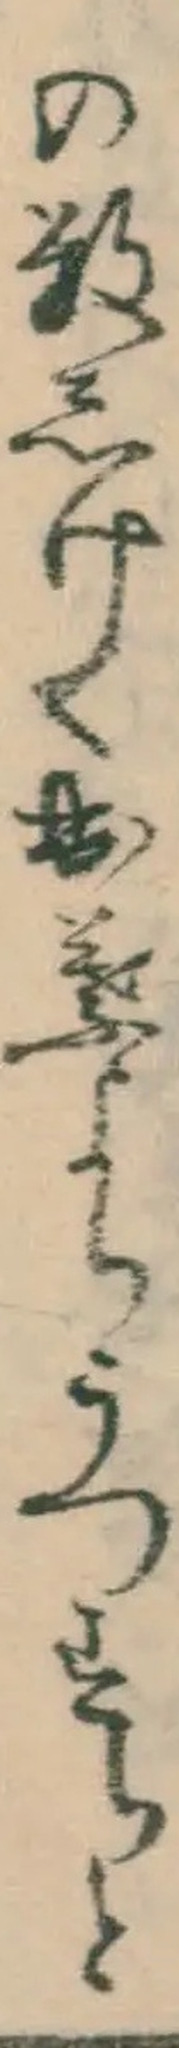の数しけく出葉よりうつすりと
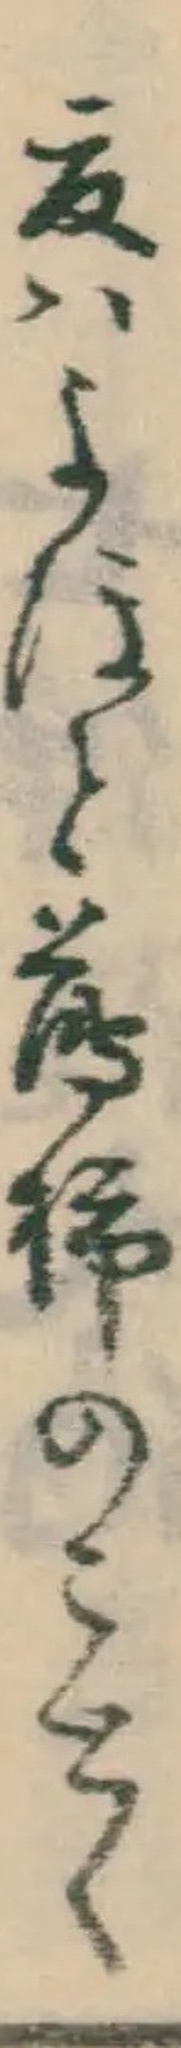夏はよほと薄柿のことく
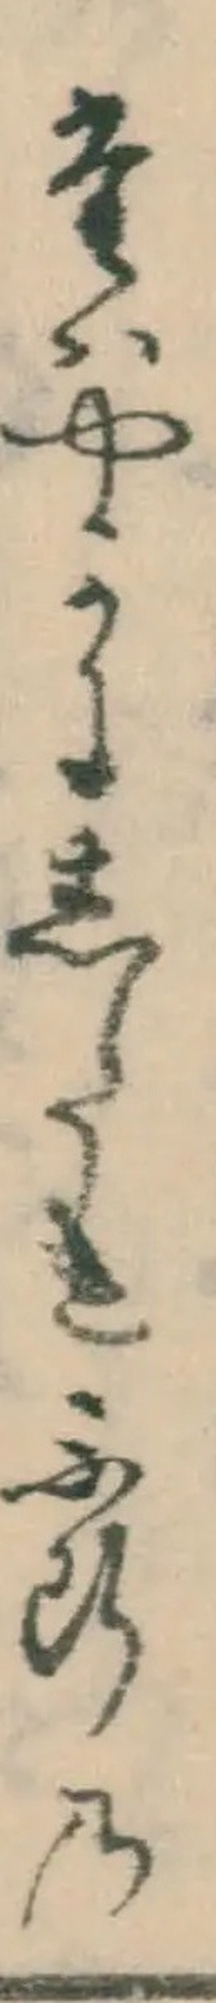たはやかにしたれ不断の
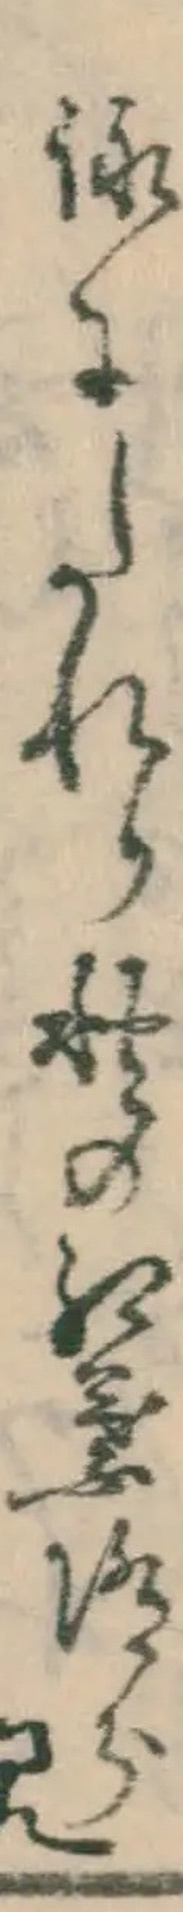詠にたれり秋の紅葉随分
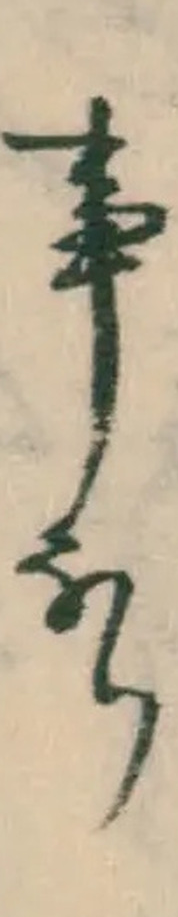事なり
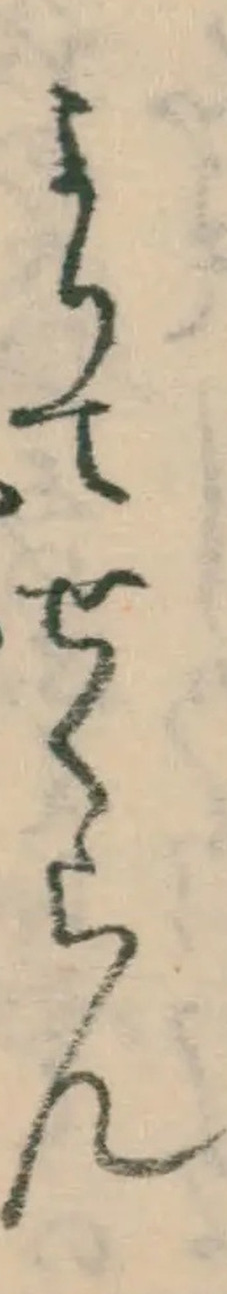よりてせくらん
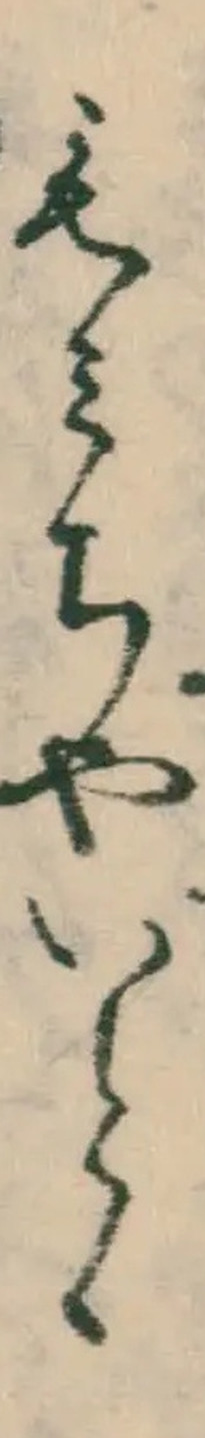もみちやいとゝ
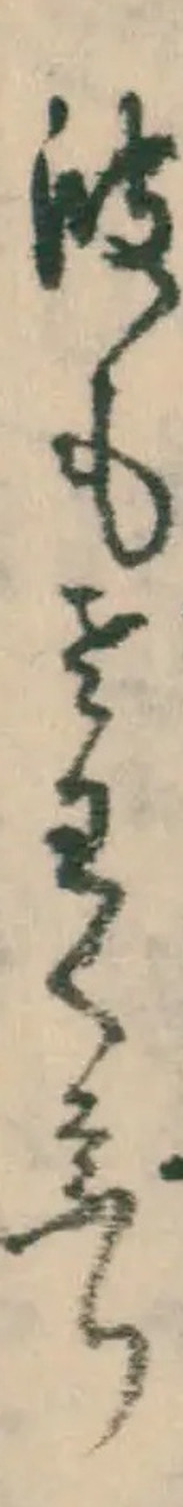波もさわくなり
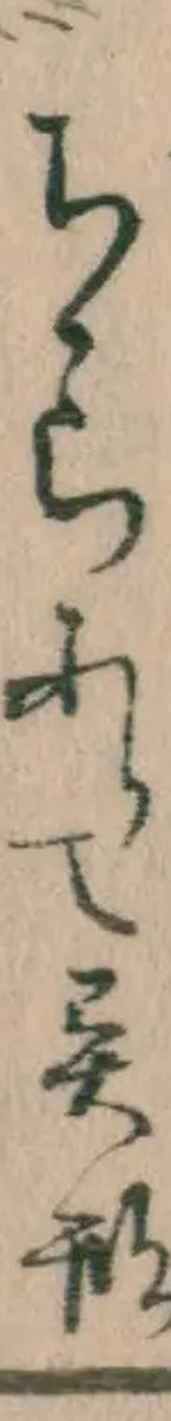ちゝらありて異形
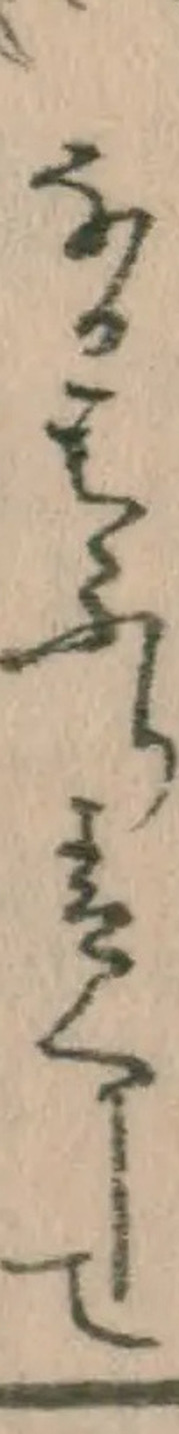なるはふり青くして
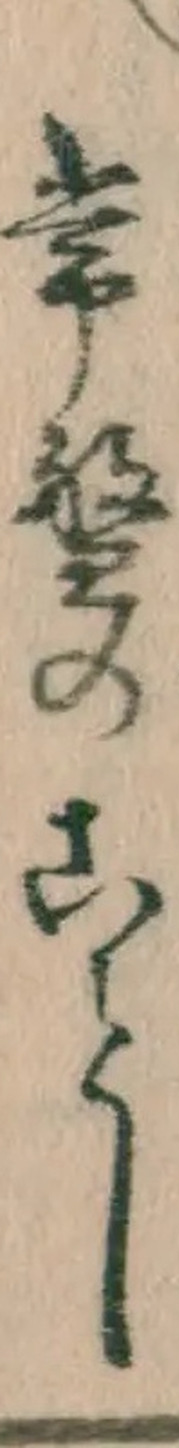常盤のことし
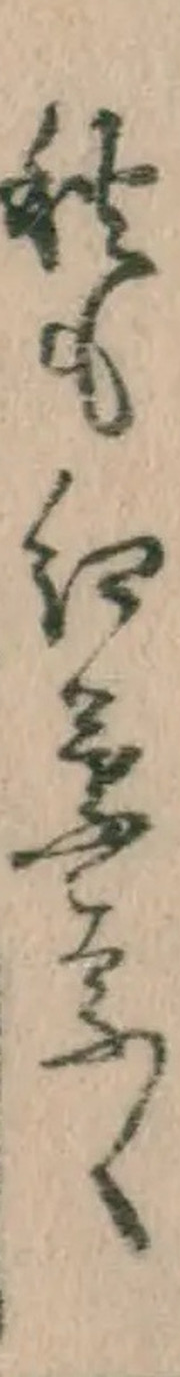秋も紅葉なく
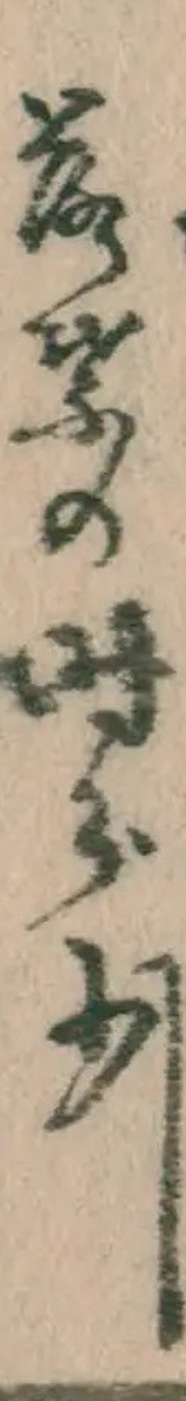落葉の時分少し
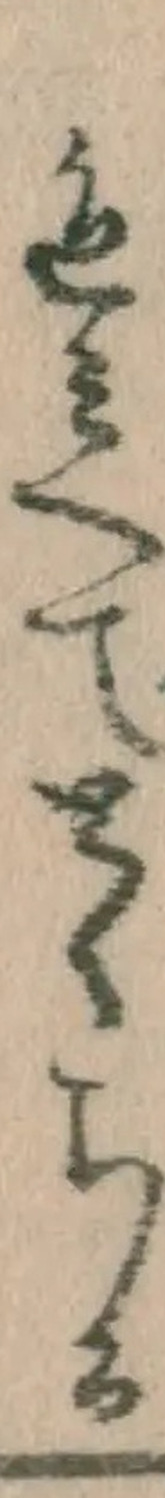色みへてとくちる
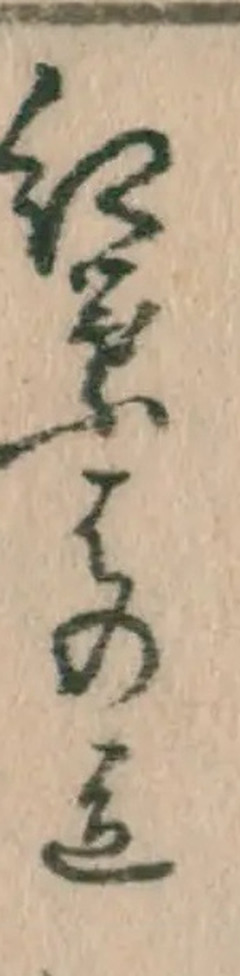紅葉はの色
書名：紅葉集
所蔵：国立国会図書館 National Diet Library, JAPAN
